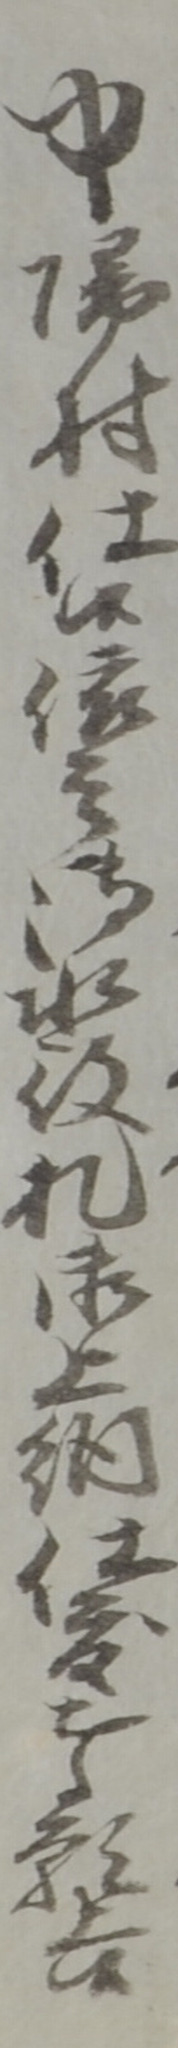中帰村仕候依之御水役札御上納仕度奉願上候

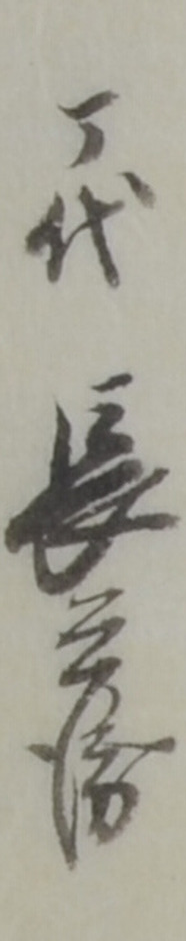丁代長兵衛
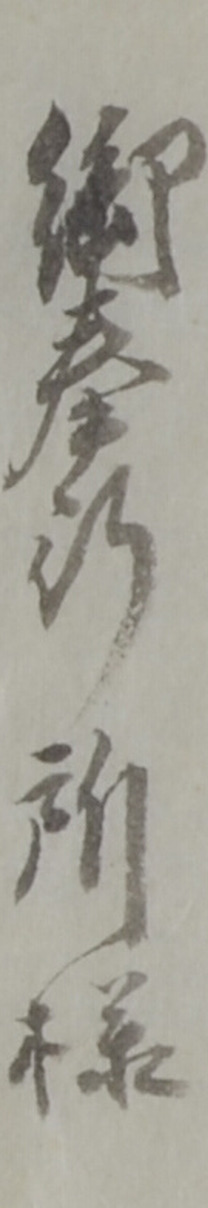御奉行所様
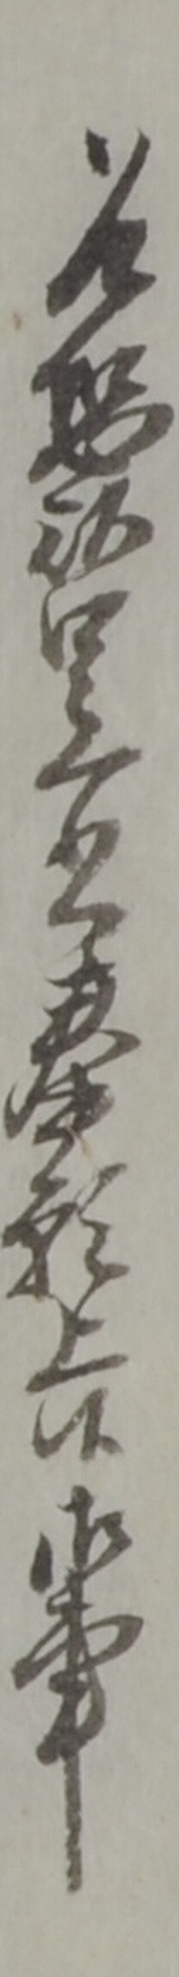乍恐以口上書奉願上候御事
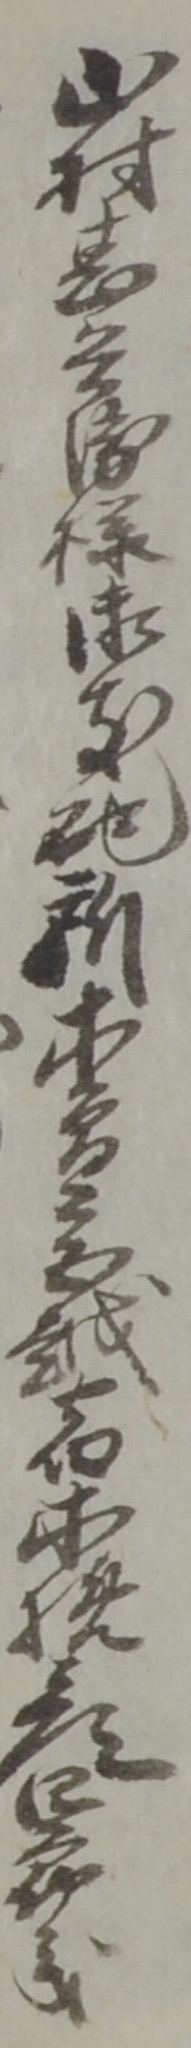山村甚兵衛様御支配所木曽宮越宿木挽彦四郎義
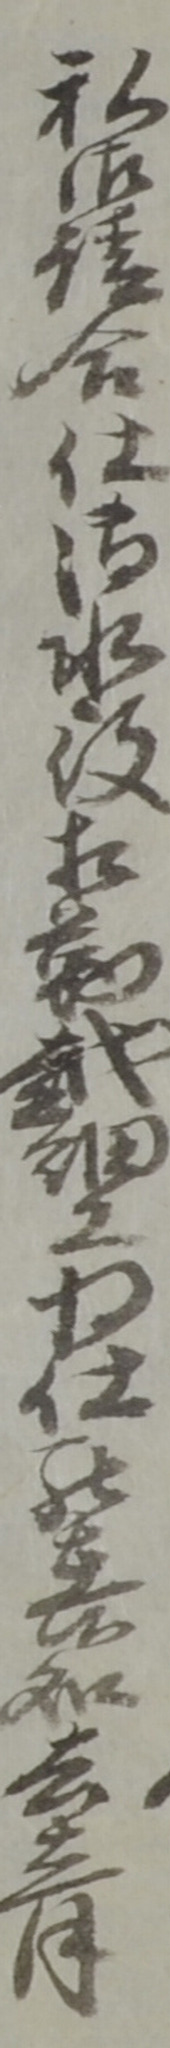私御請合仕御水役相勤越細工為仕罷在候処去十二月
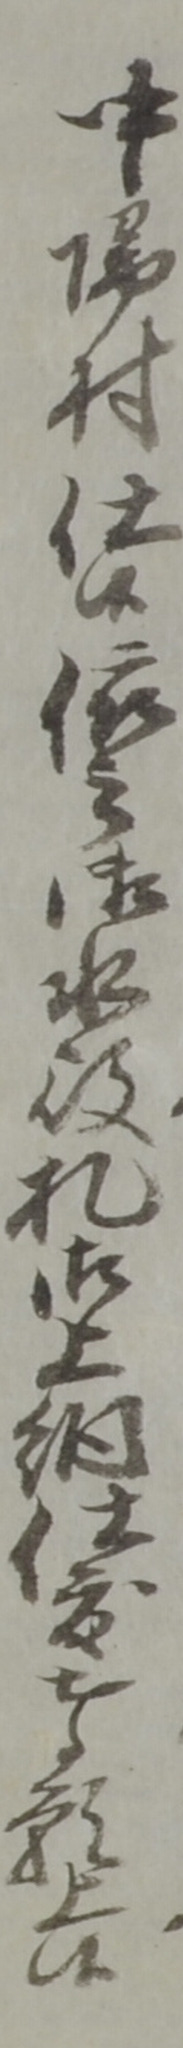中帰村仕候依之御水役札御上納仕度奉願上候
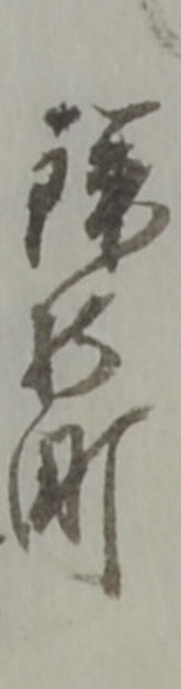鉾持町
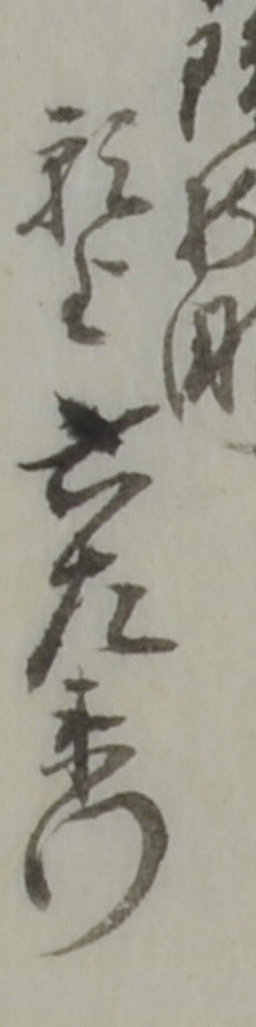願主六左衛門
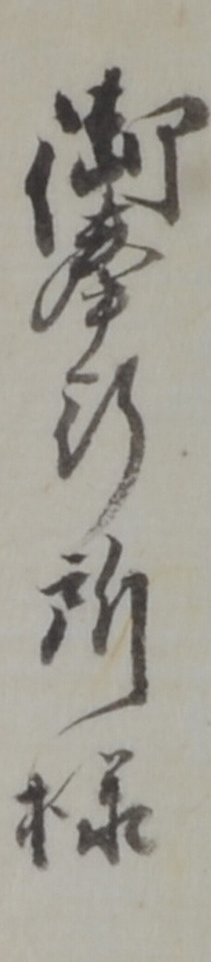御奉行所様
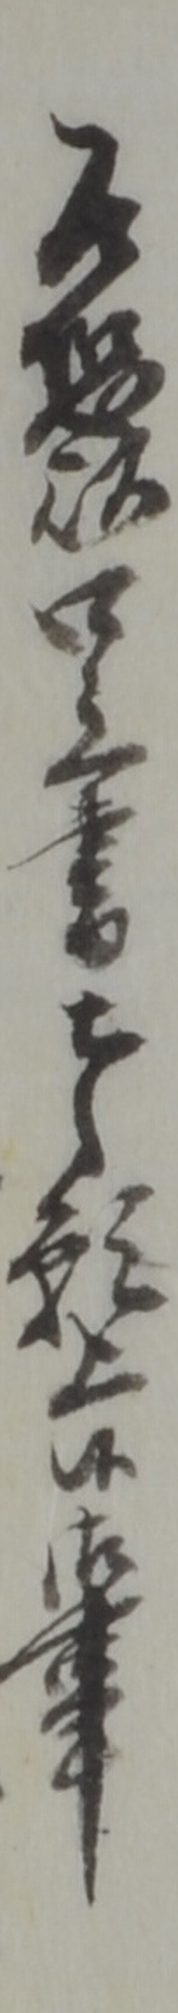乍恐以口上書奉願上候御事
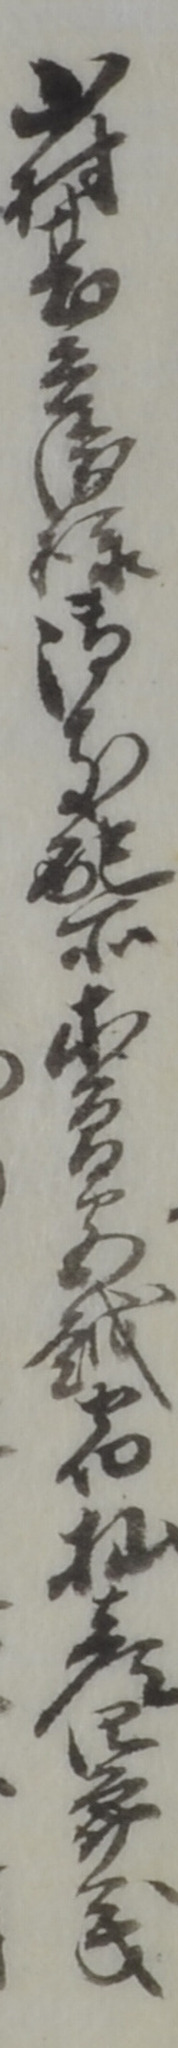山村甚兵衛様御支配所木曽宮越宿杣彦四郎義
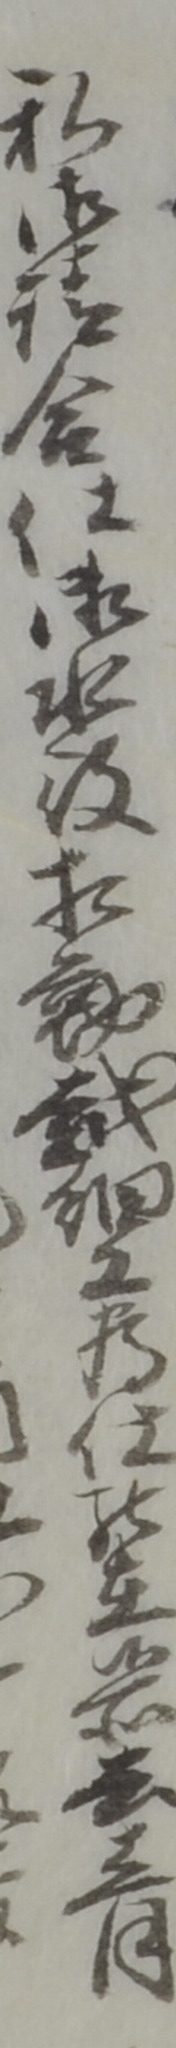私御請合仕御水役相勤越細工為仕罷在候所去十二月
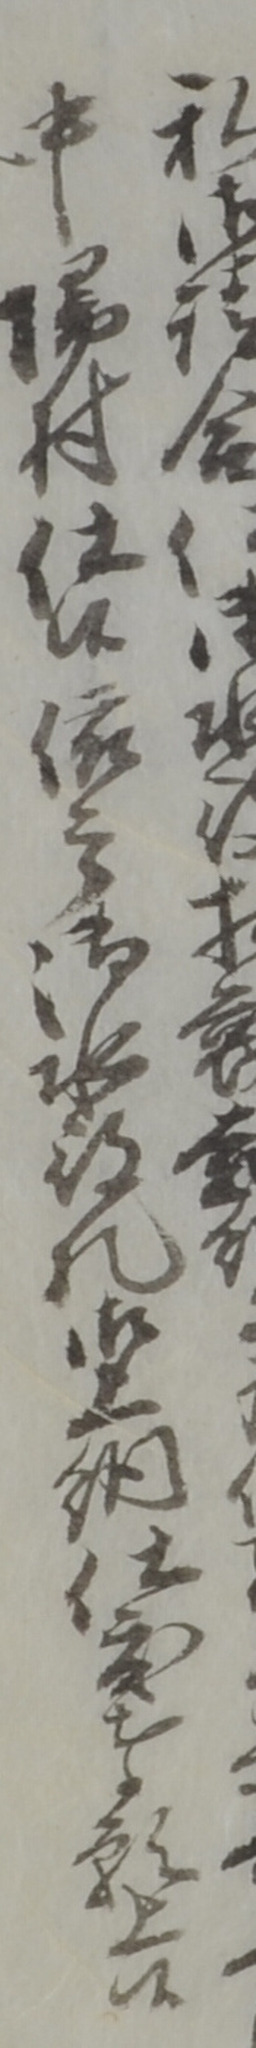中帰村仕候依之御水役札御上納仕度奉願上候
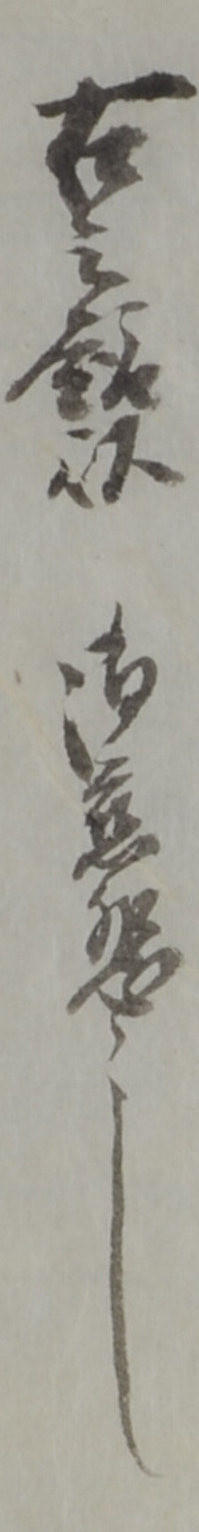右之趣以御慈悲ーーー
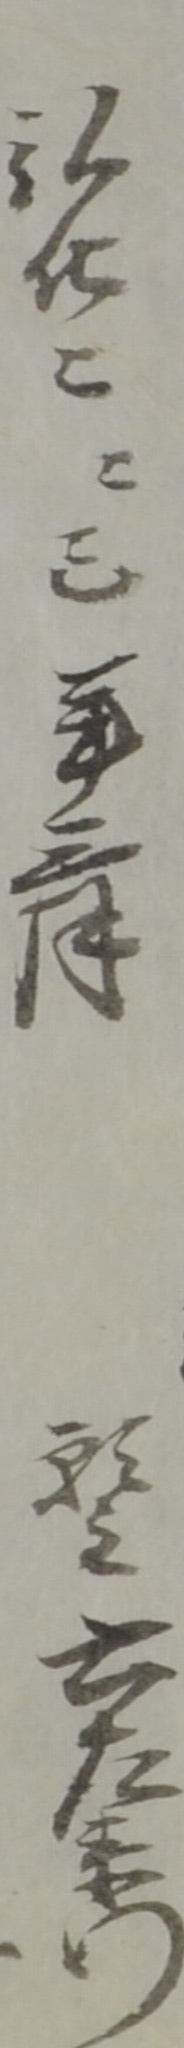弘化二乙巳年三月願主六左衛門
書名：諸願書控簿
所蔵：伊那市立高遠町図書館・合同会社AMANE
